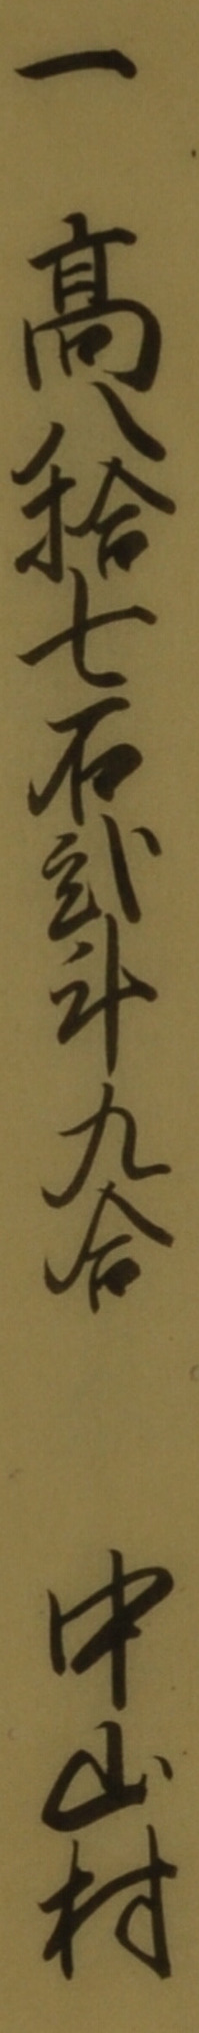一高八拾七石弐斗九合中山村
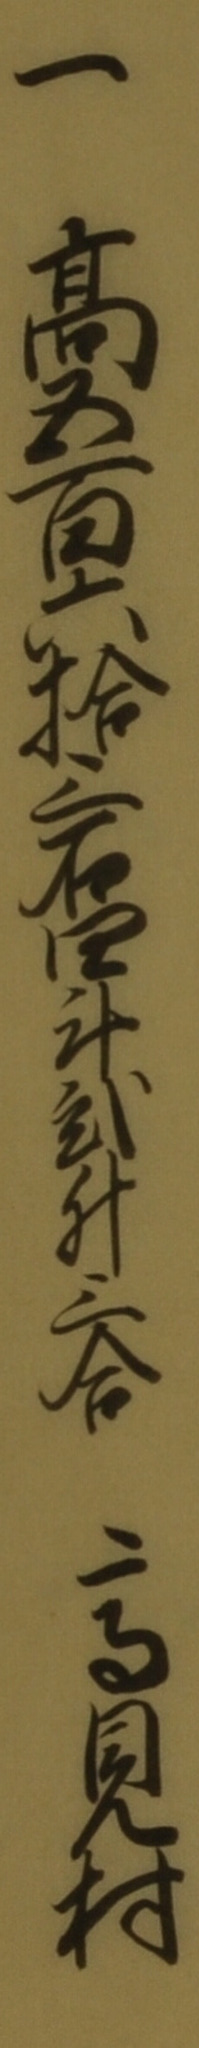一高五百六拾三石四斗弐升三合高見村
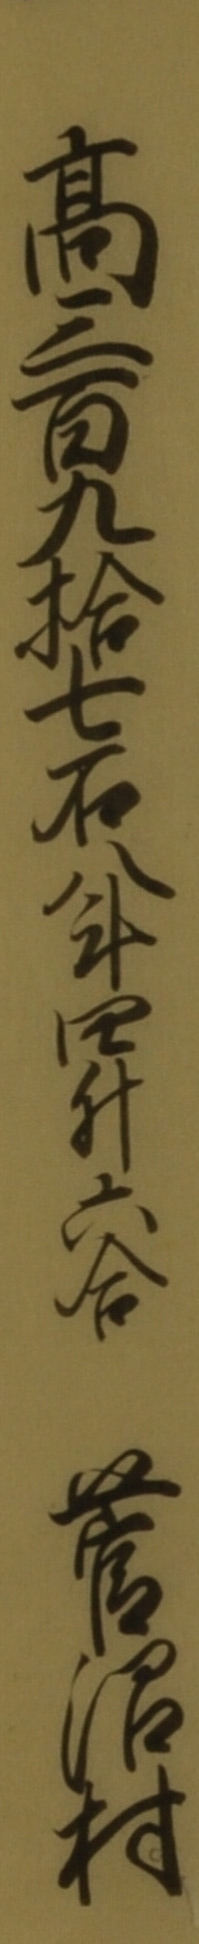一高三百九拾七石八斗四升六合菅沼村

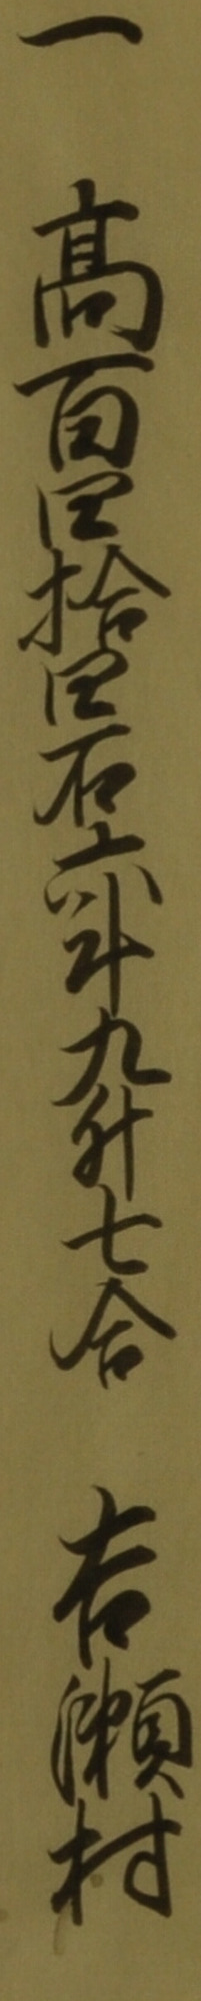一高百四拾四石六斗九升七合吉瀬村
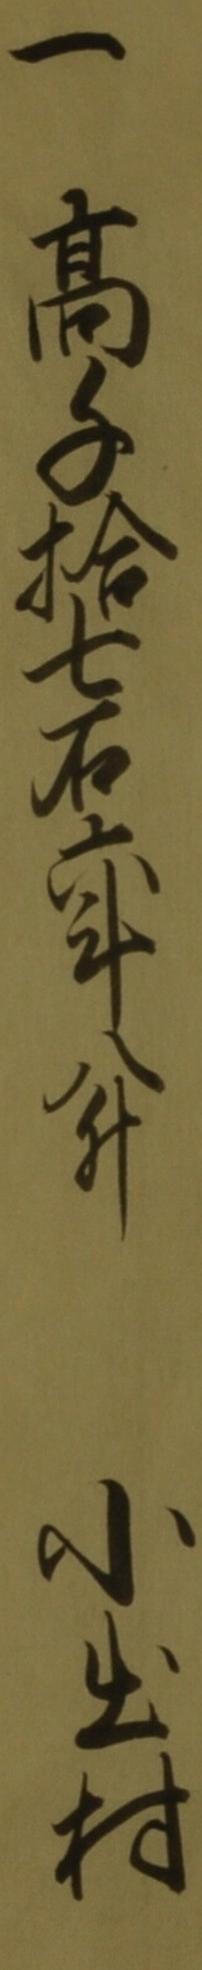一高千拾七石六斗八升小出村
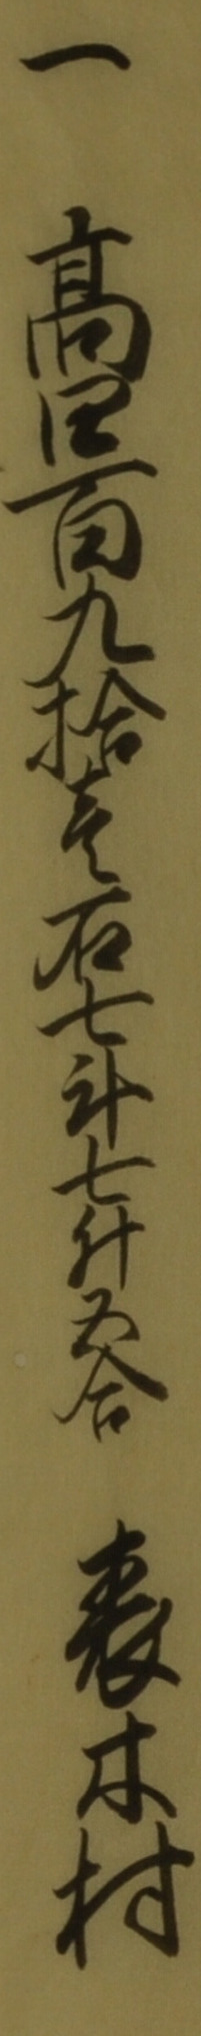一高四百九拾壱石七斗七升五合表木村
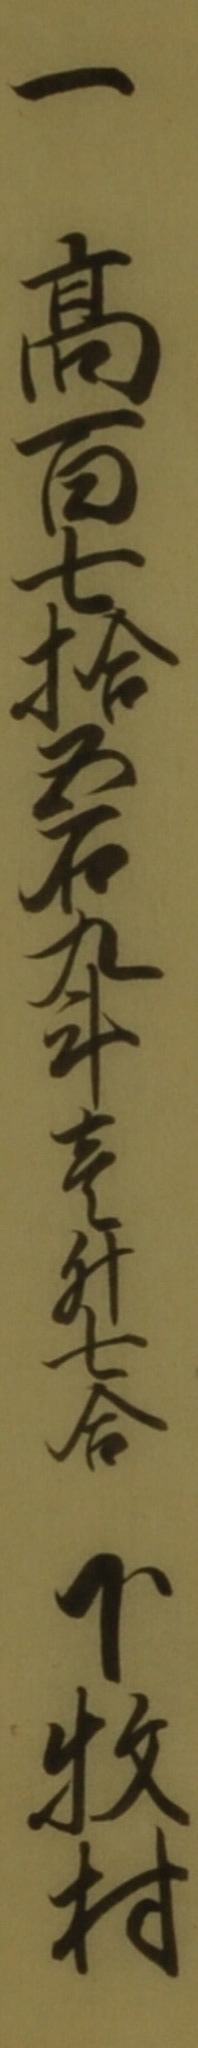一高百七拾五石九斗壱升七合下牧村
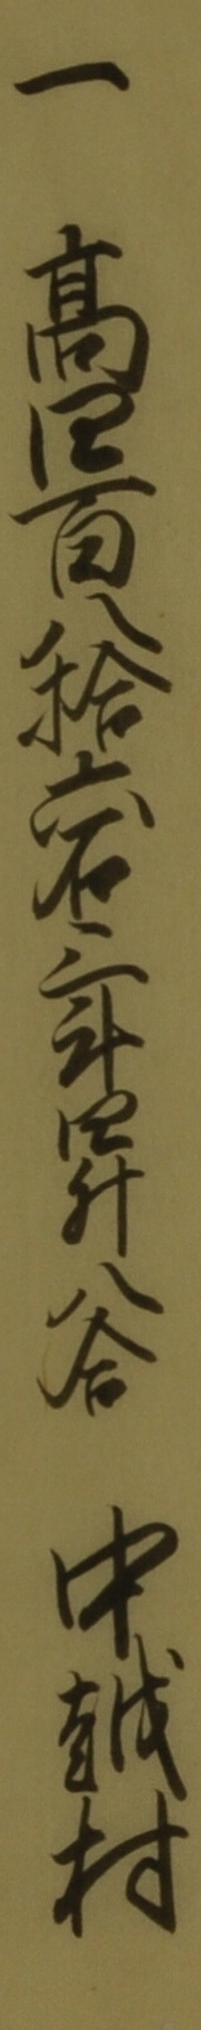一高四百八拾六石三斗四升八合中越村

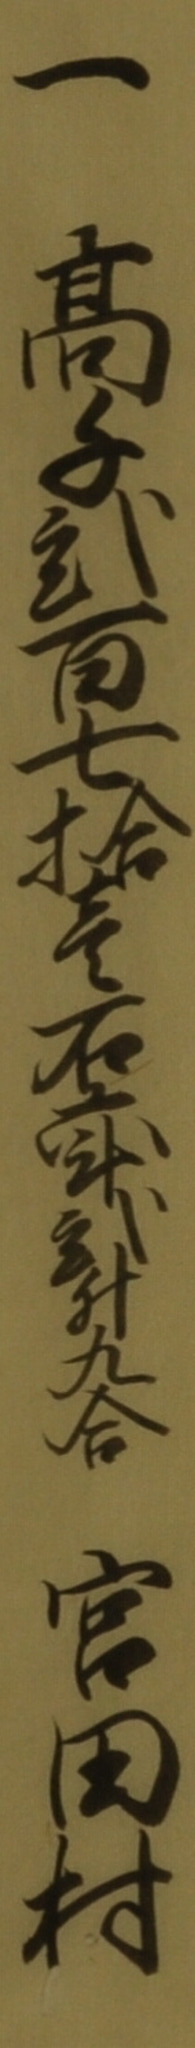一高千弐百七拾壱石六斗弐升九合宮田村
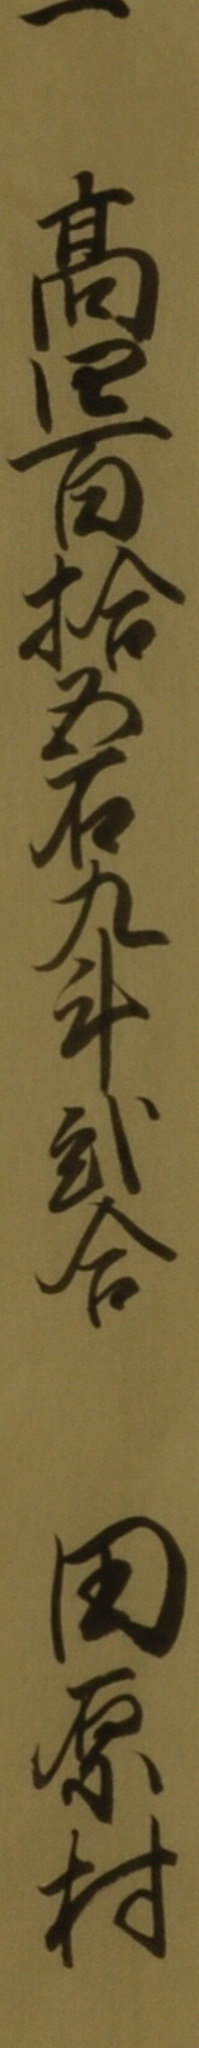一高四百拾五石九斗弐合田原村
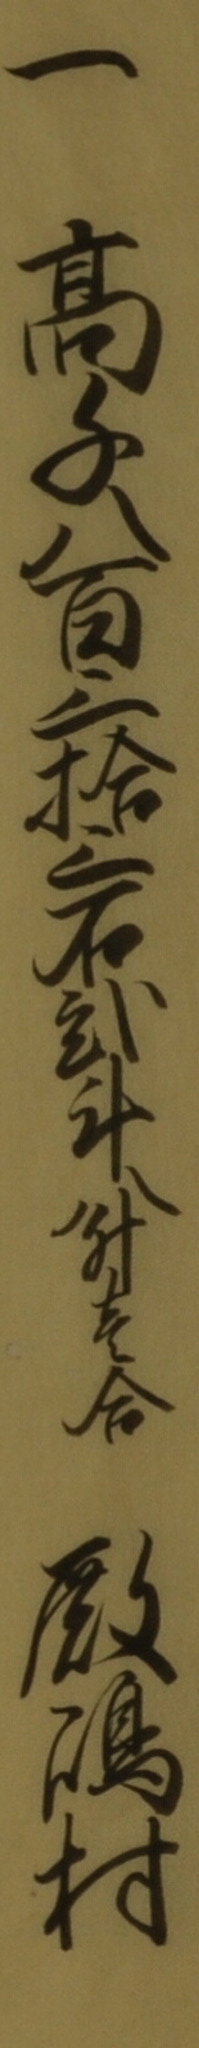一高千八百三拾三石弐斗八升壱合殿島村
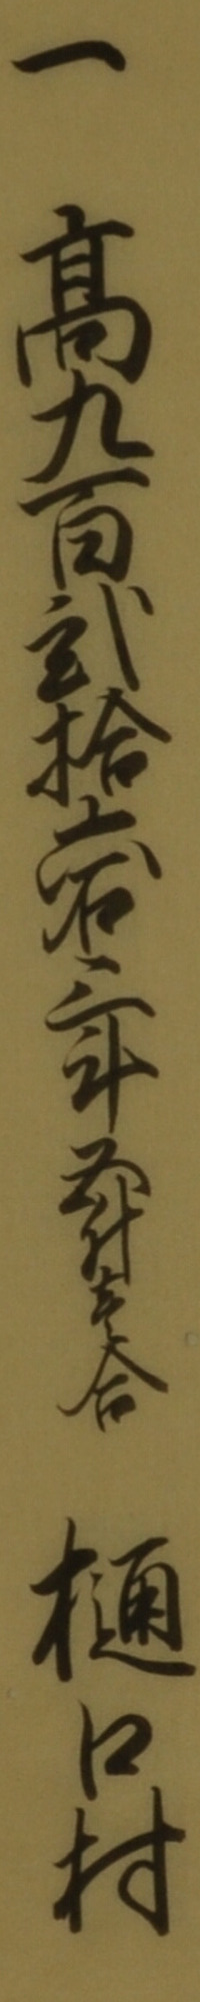一高九百弐拾六石三斗五升壱合樋口村
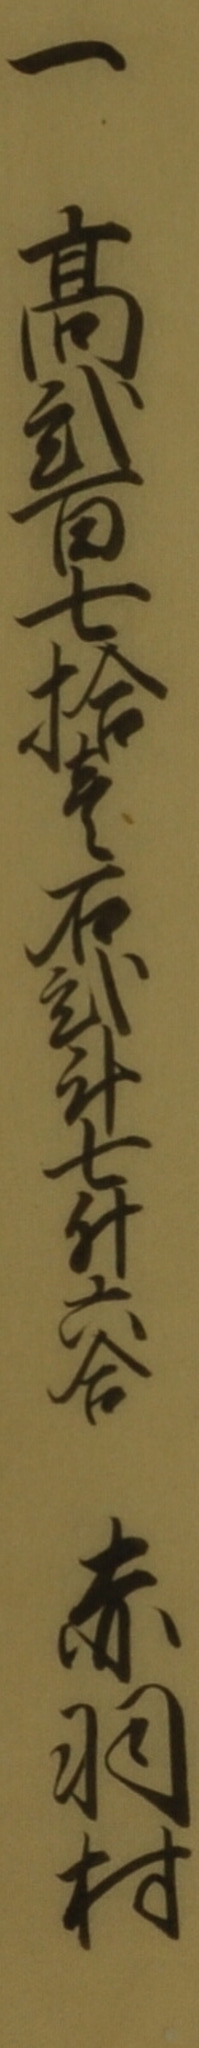一高弐百七拾壱石弐斗七升六合赤羽村

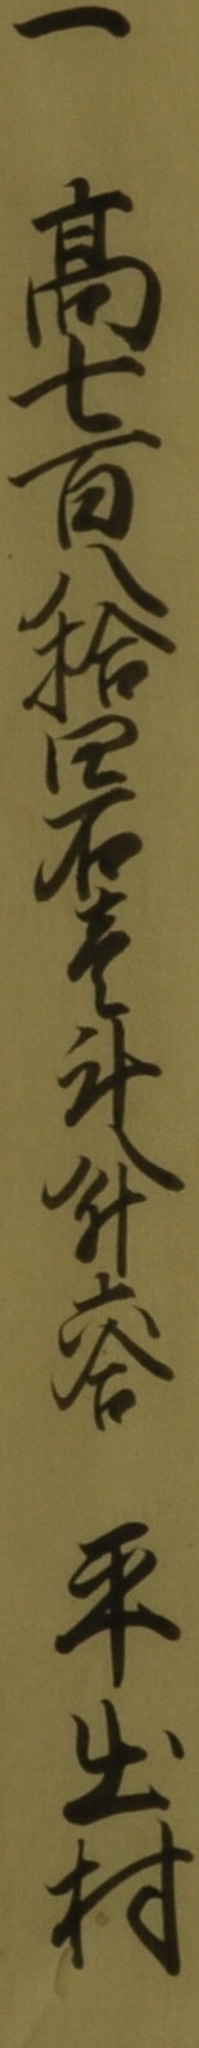一高七百八拾四石壱斗八升六合平出村
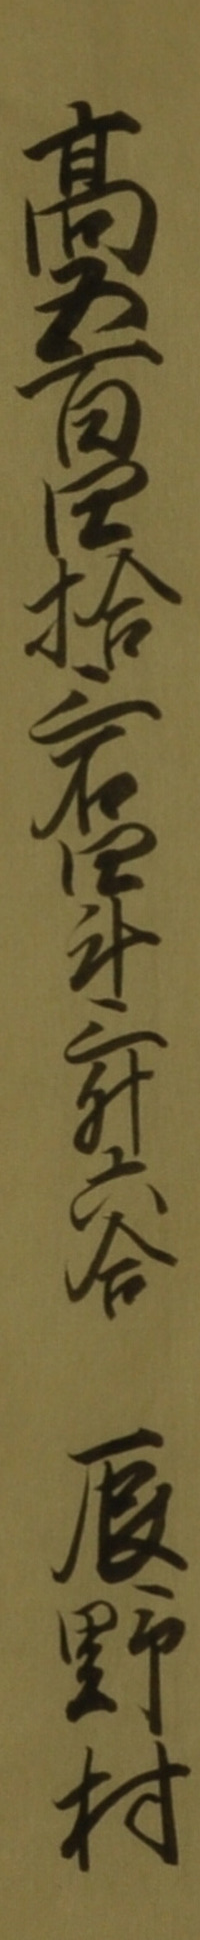一高五百四拾三石四斗三升六合辰野村
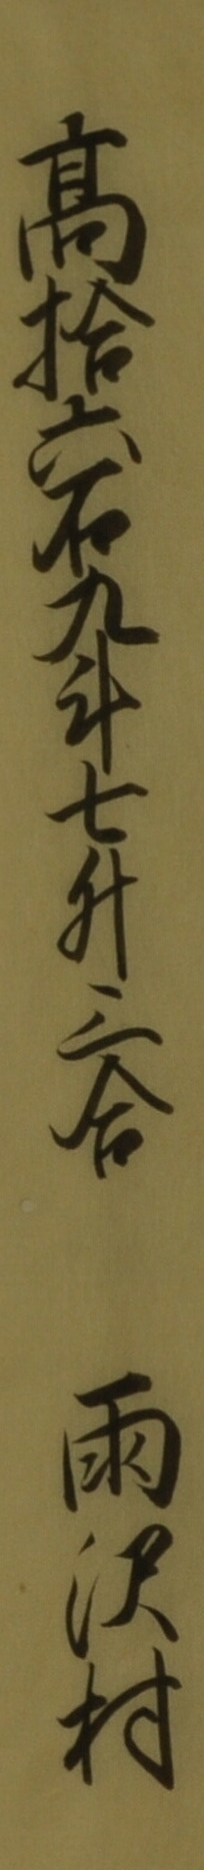一高拾六石九斗七升三合雨沢村
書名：信濃国伊那郡筑摩郡高遠領知郷村高辻帳
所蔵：伊那市立高遠町図書館・合同会社AMANE
